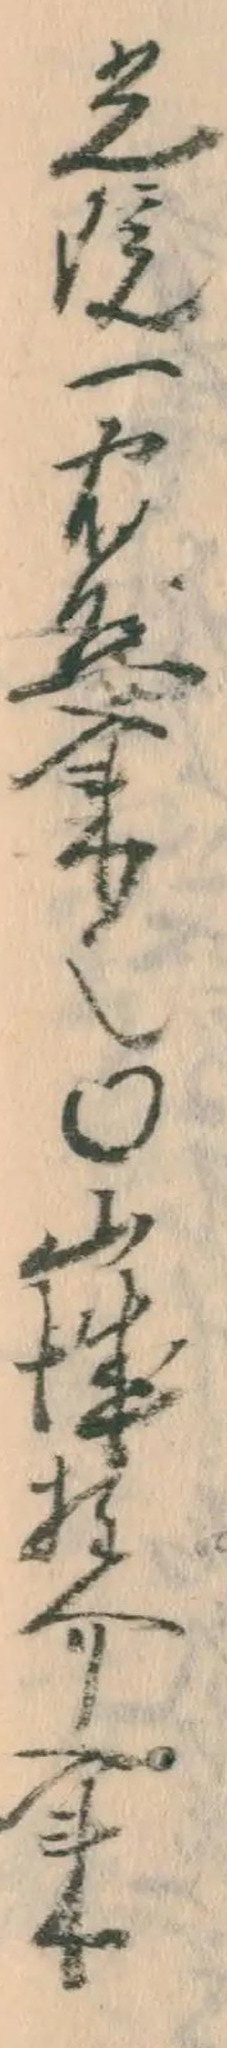光院一宿懸入来也○山城権介入来
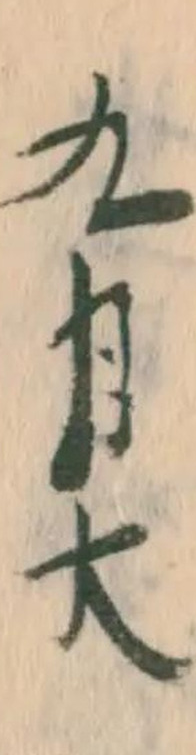九月大
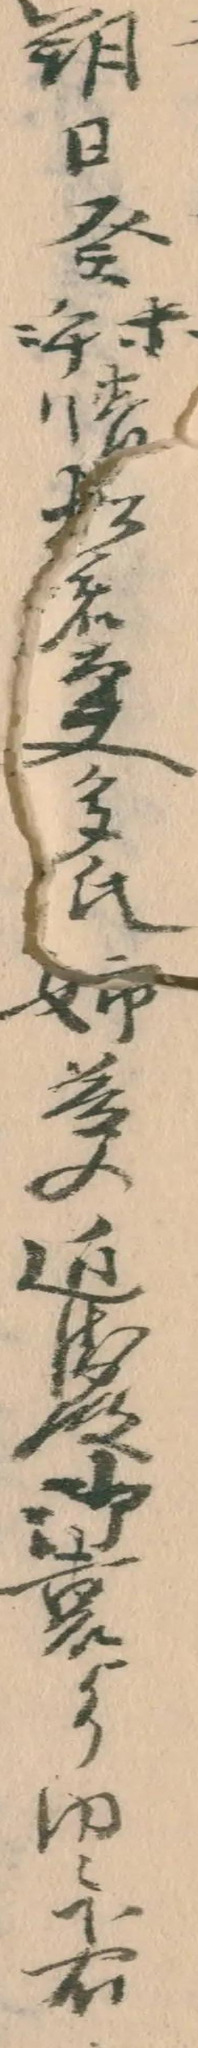朔日癸未晴松若大夫多氏姉藤の近衛殿御裏より内々下宿
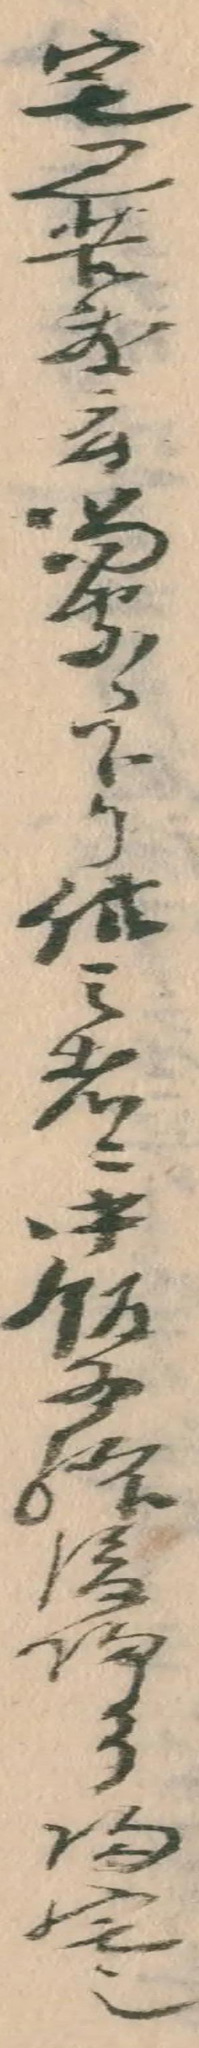宅見苦敷ニ付當家へ下り供之者ニ中飯為給後帰より帰宅也
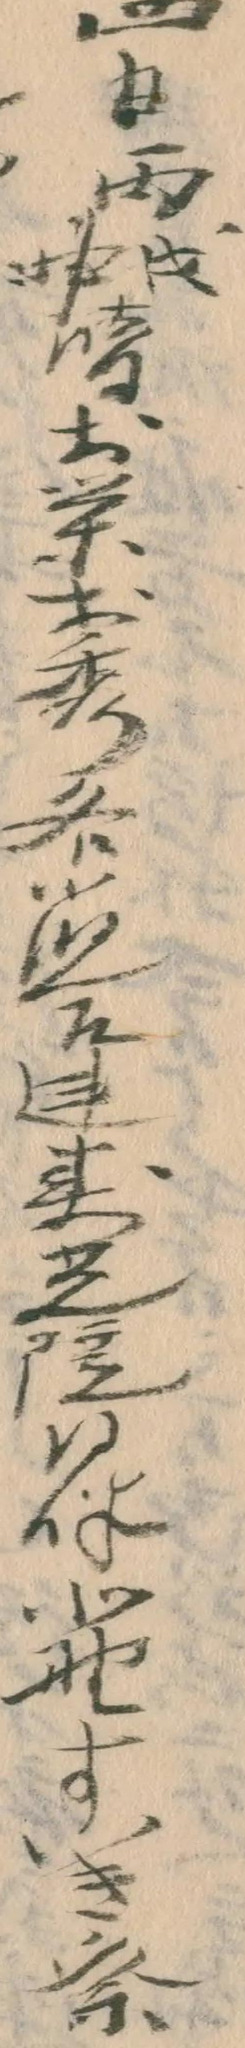四日丙戌晴お栄お秀各小児召連壽光院同伴北野すいき祭
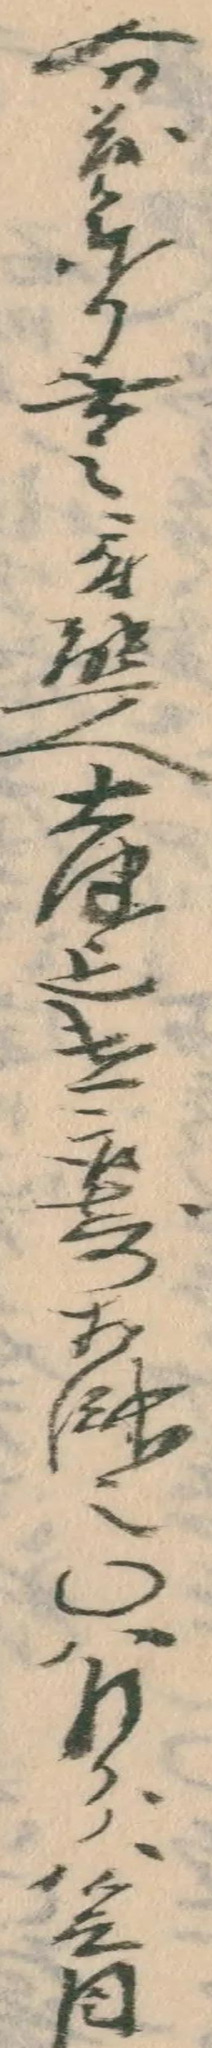分も参り無之ニ付熊一人大津迄遣取寄相済也○八月分ハ會目
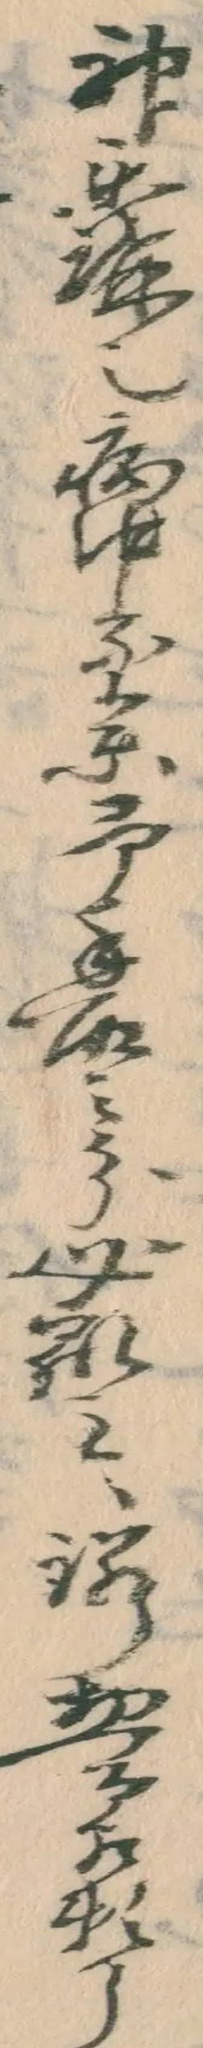神楽講也病中不参予年所之分必顕主へ諾惣而相頼申了
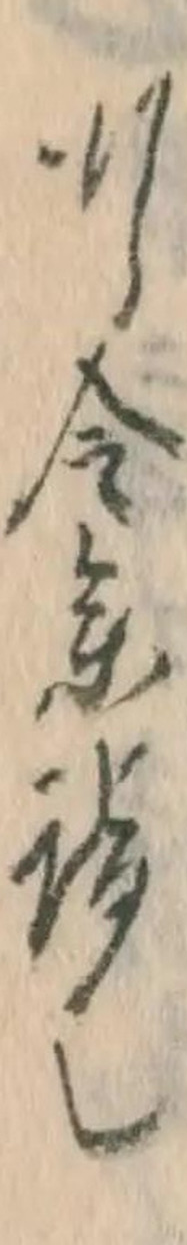行令参詣也
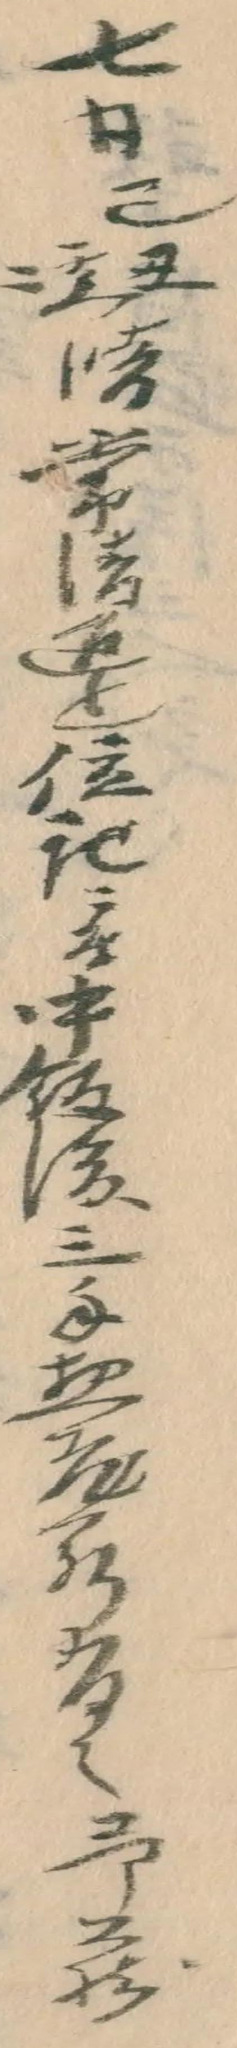七日己丑晴常清返上位記ニ付中飯後三手惣老若有之予蔵
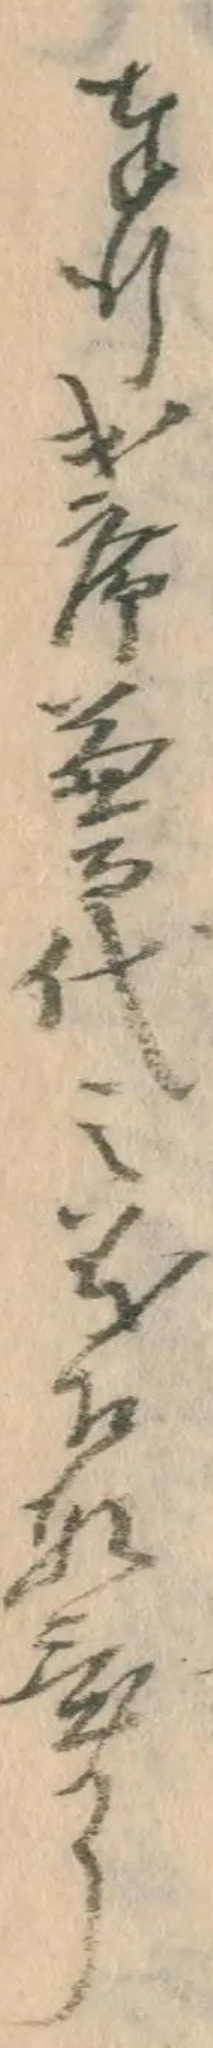奉行出席兼而代之義相願置了

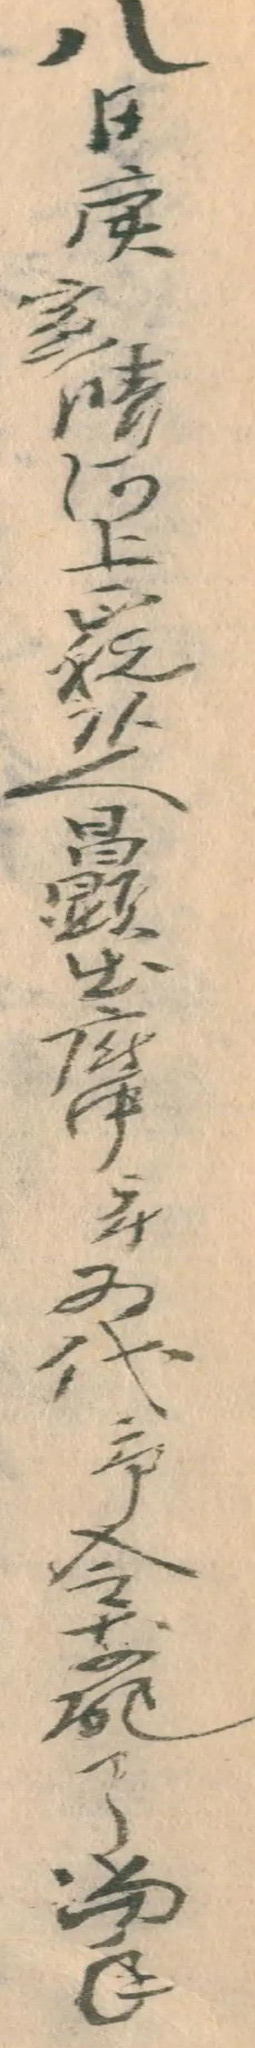八日庚寅晴河上正税頭人昌顕出府中ニ付為代予令支配了當年
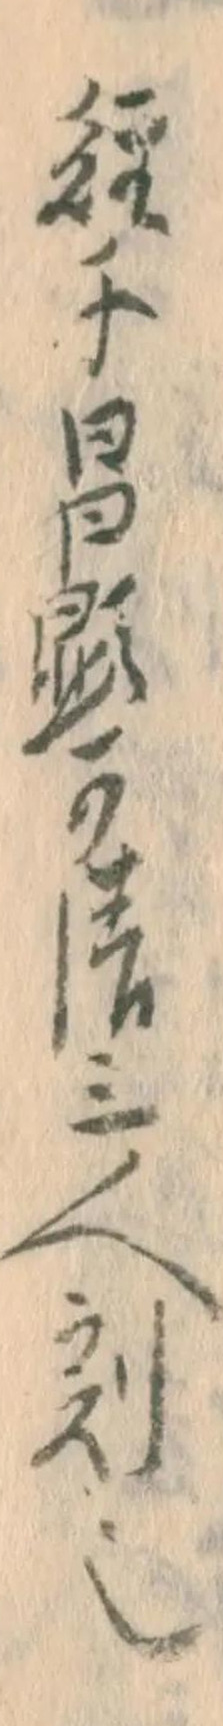経千昌顕可清三人割也
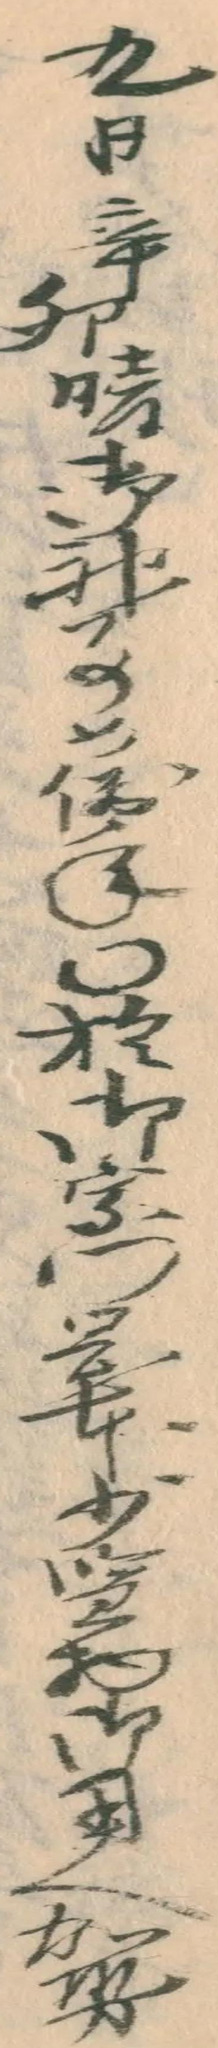九日辛卯晴御神事如例年○於御家門岡本少監物御用人加勢
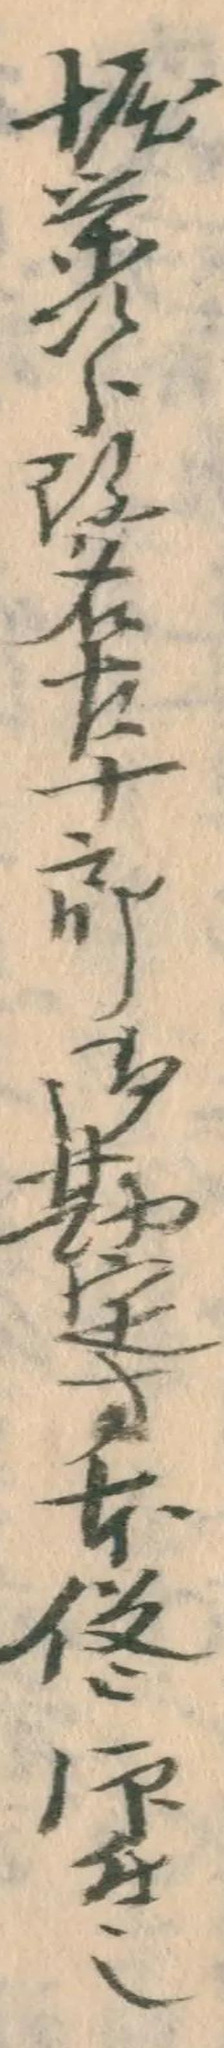堀栄次郎改名左十郎御勘定方本役被仰付也
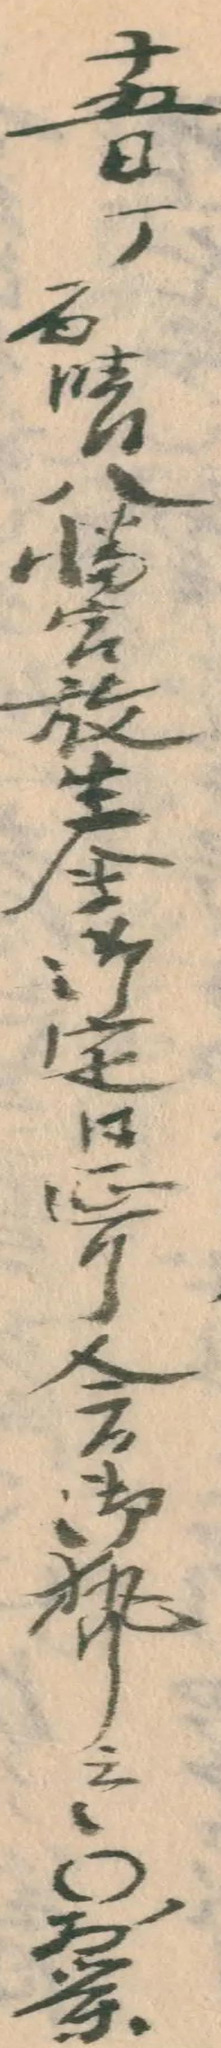十五日丁酉晴八幡宮放生會御定日延引今日御執行云〻○お栄
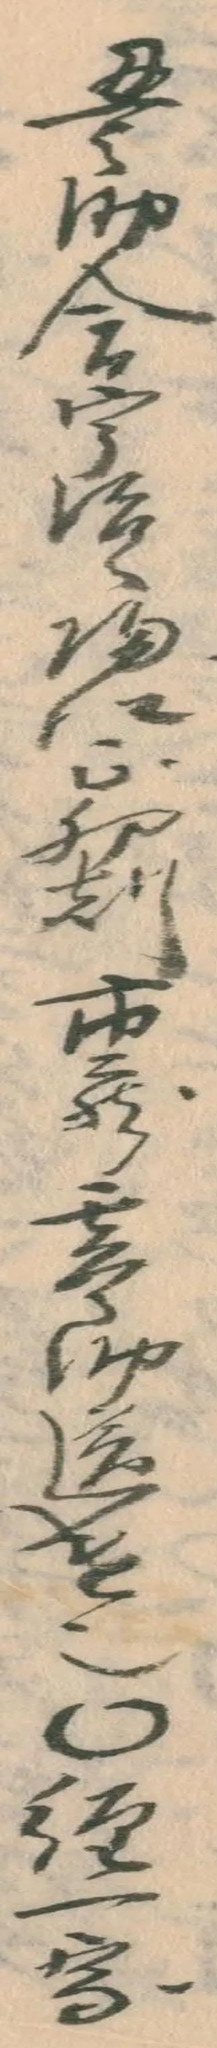丑之助今日宇治へ帰郷正卯刻市蔵亥之助送遣也○経一家
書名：賀茂社記録. 第70冊
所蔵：国立国会図書館 National Diet Library, JAPAN
